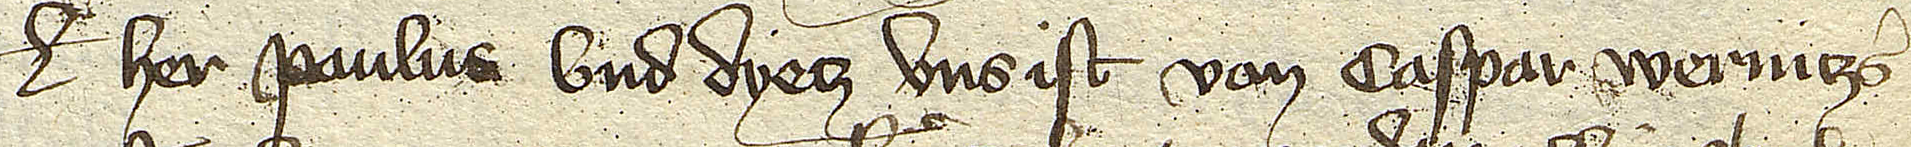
L* her paulus vnd dyecʒ Vns iſt von Caſpar wernicʒs*
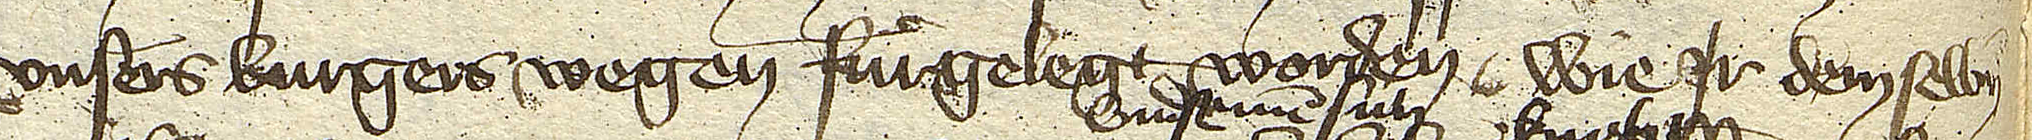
vnſers burgers wegen fürgelegt worden / wie Ir demſelbn*
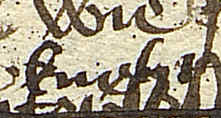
kneht
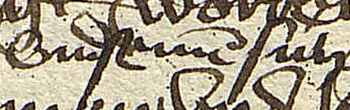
vnd ſeine* ſun
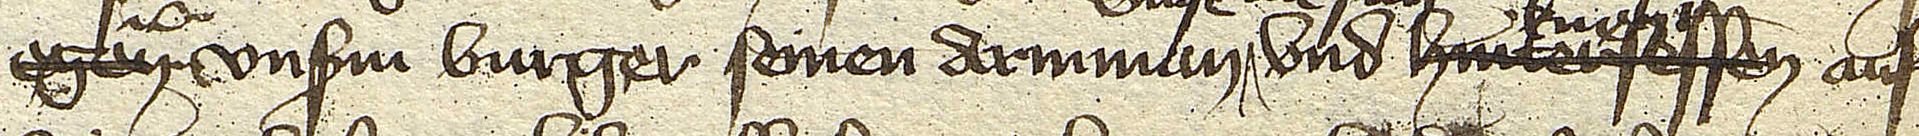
egen* ~ vnſ*m buirger ſeinen Armman vnd hinterſeſſen auf
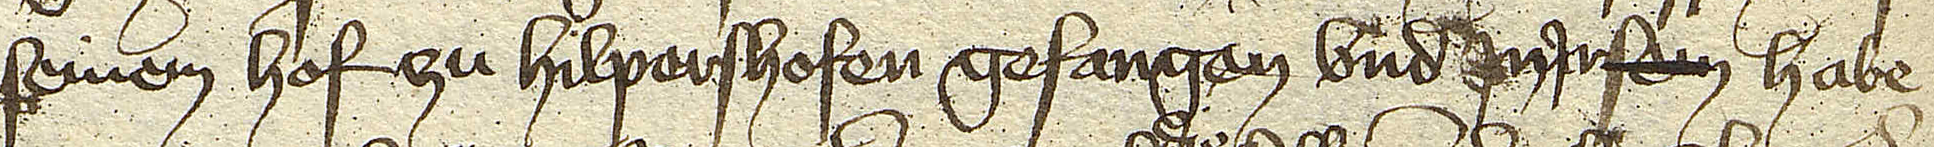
ſeinem hof cʒu hilerſhofen gefangen vnd In Ir ſein habe
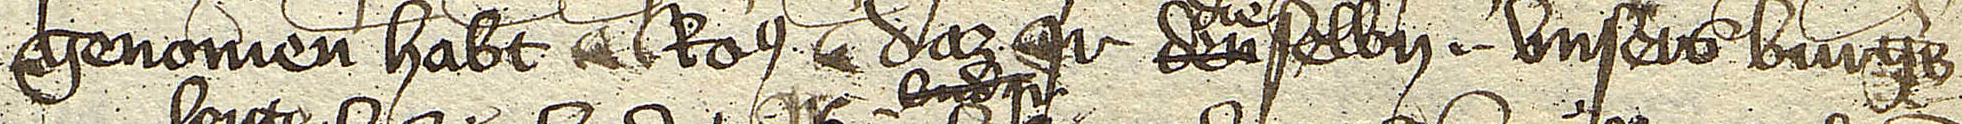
genomen habt / Ro* / daʒ Ir den ſelbn* ~ vnſers burg*s
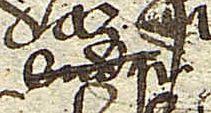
vnd Ir
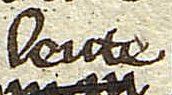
leute
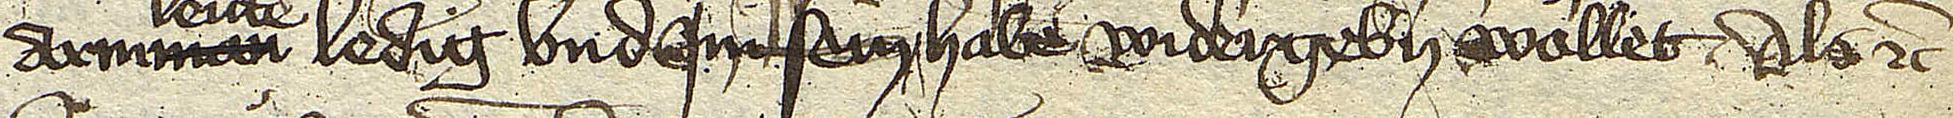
Armman ledig vnd Im ſein habe widergebn* wöllet / Als ec*
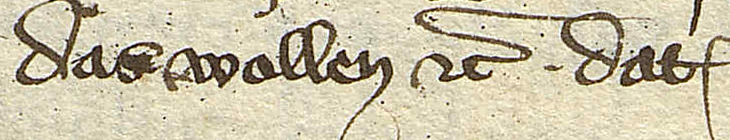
das wöllen ec* . dat*
